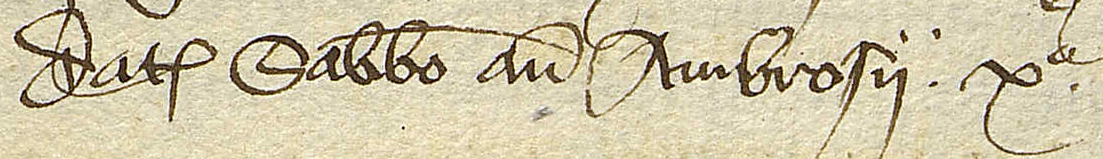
Dat* Sabbo* an* Ambroſii* . x* .
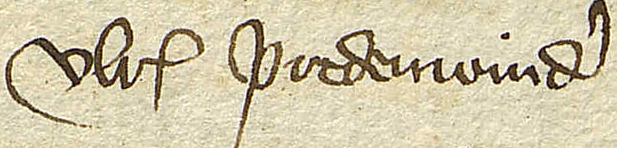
vlr* Predenwind*
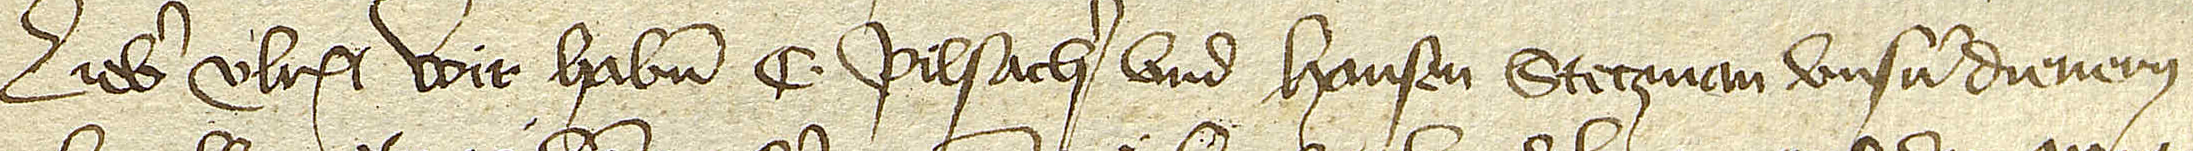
Lieb* vlr* / Wir habn* C* . Pilſach* vnd hanſen Stecʒman vnſn* dienern
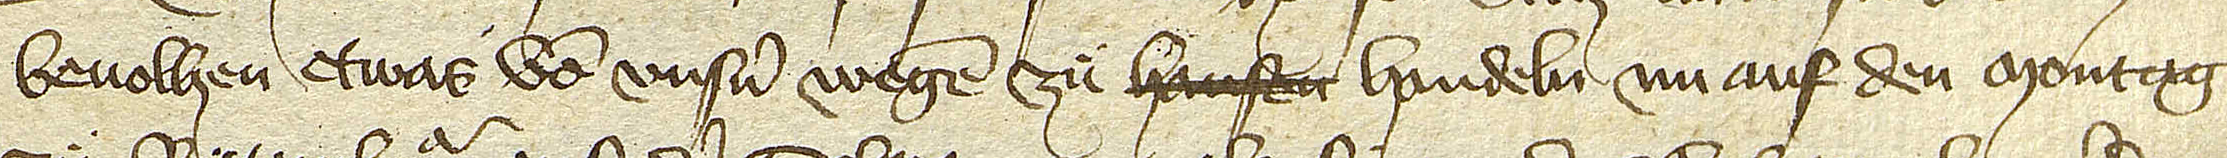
beuolhen etwas vo* vnſn* wege* cʒü hanſen handeln nu auf den Montag
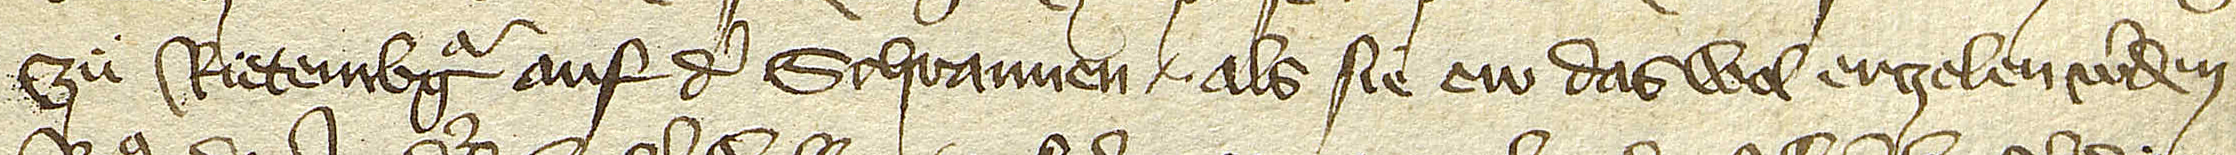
cʒü Rietembg* auf d* Schrannen / als ſie ew das Wol ercʒelen w*den
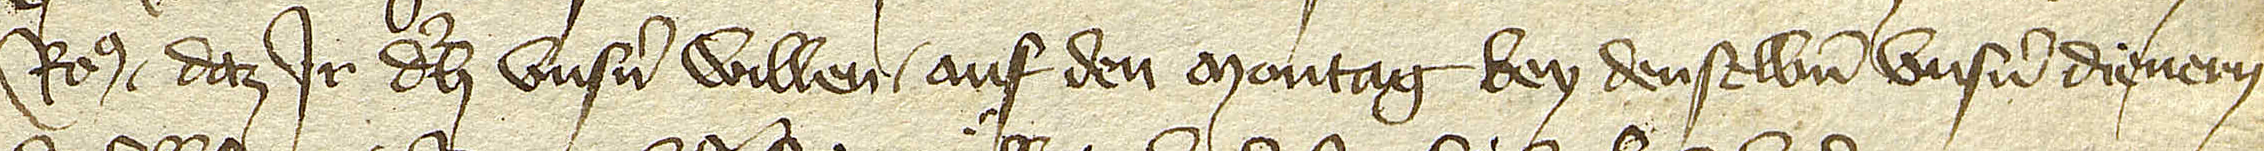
Ro* / daʒ Ir d*h vnſn* willen / auf den Montag bey denſelbn*vnſn* dienern
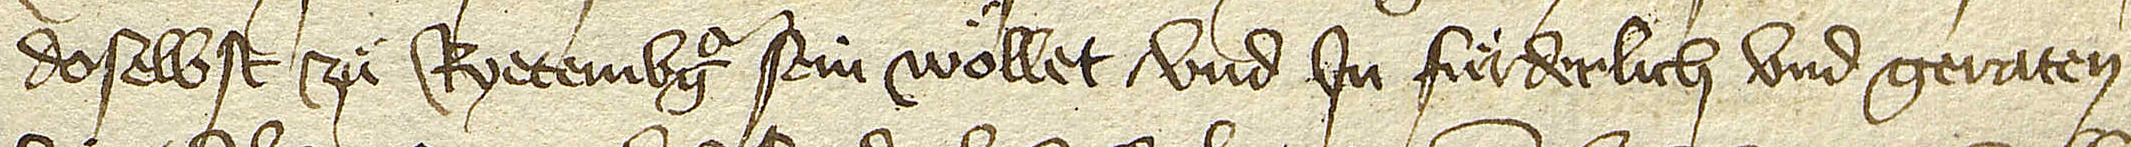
doſelbſt cʒü Ryetemb*g ſein wöllet / vnd In fürderlich vnd geraten
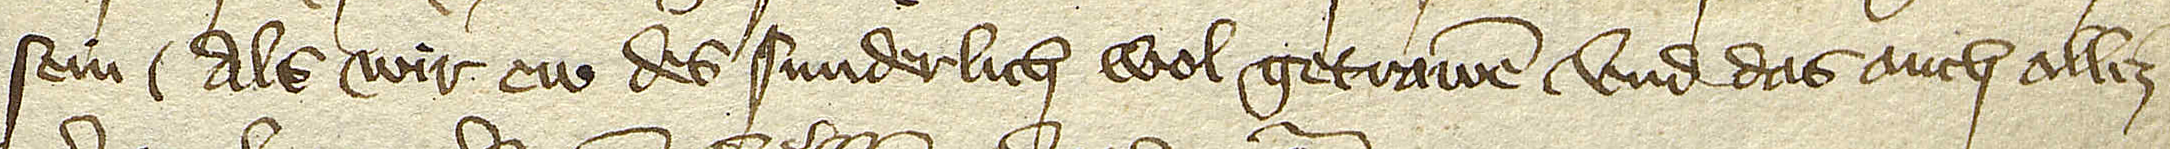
ſein / Als wir ew des ſunderlich wol getrawe* / vnd das auch allcʒ*
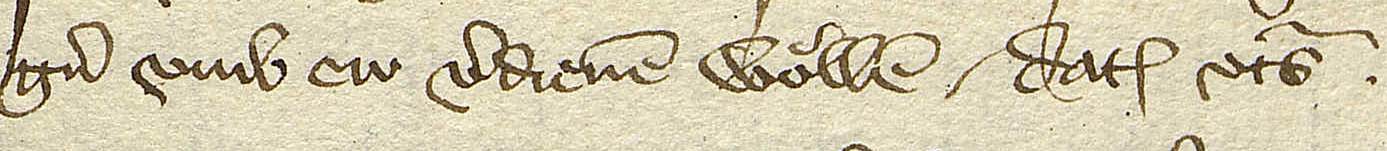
gn* vmb ew v*diene* wölle* / dat* vts* .
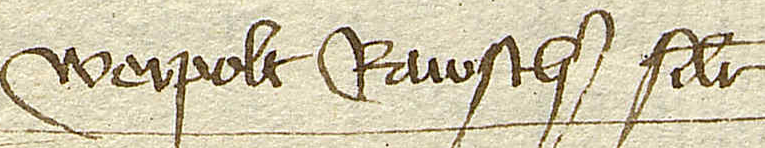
werpolt Rawſch* ſilr*
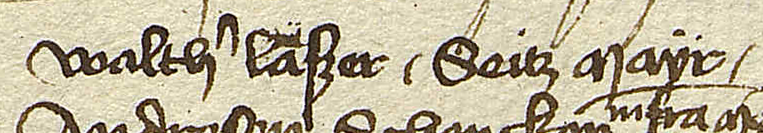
walth* laſʒer / Seitʒ Mayr /
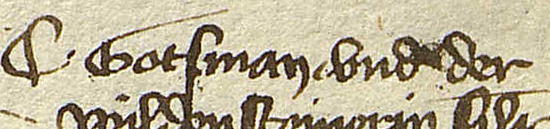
C . Gotſman / vnd der
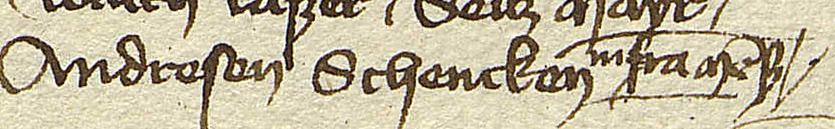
Andreſen Schencken infra* Me* ſ* / .
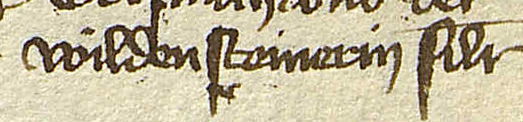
wildenſteinerin ſilr*
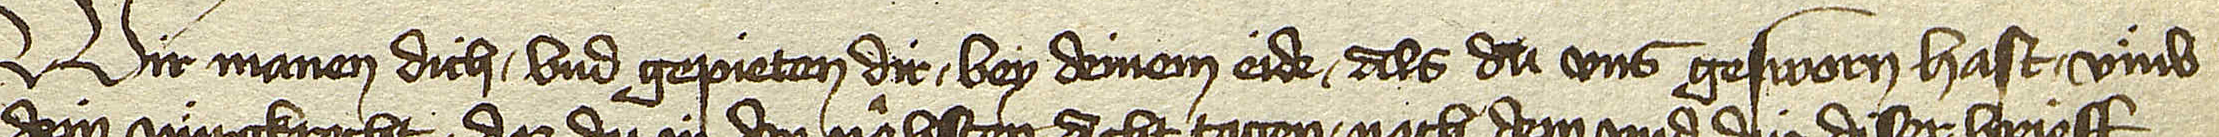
Wir manen dich / vnd gepieten dir / bey deinen eide / Als du vns geſworen haſt / v̈mb
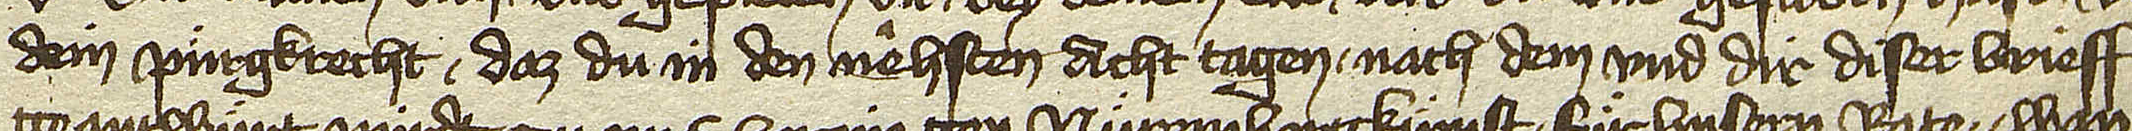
dein pürgkrecht / daʒ du in den nehſten Acht tagen / nach dem vnd dir diſer brieff
